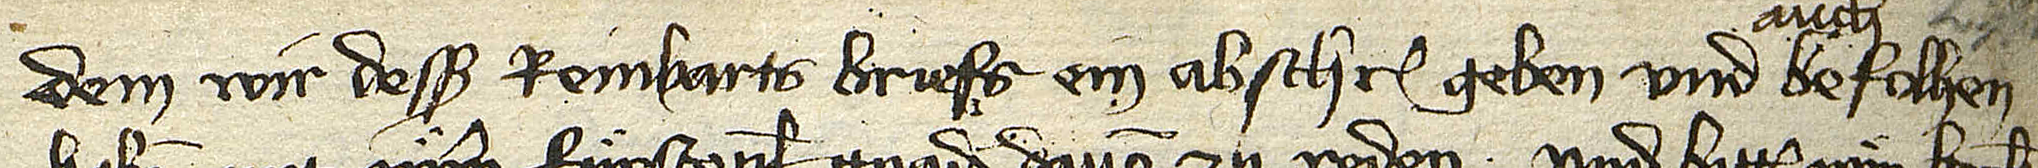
dem wir deſſ* Reinharts briefs ein abſchr* geben vnd befolhen
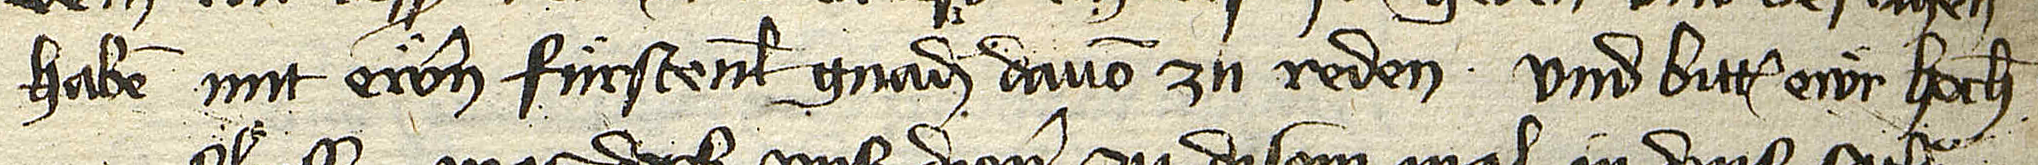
habe* mit ew*n fürſtenl* gnad* dauo* ʒu reden . vnd bitt* ew*r hoch*
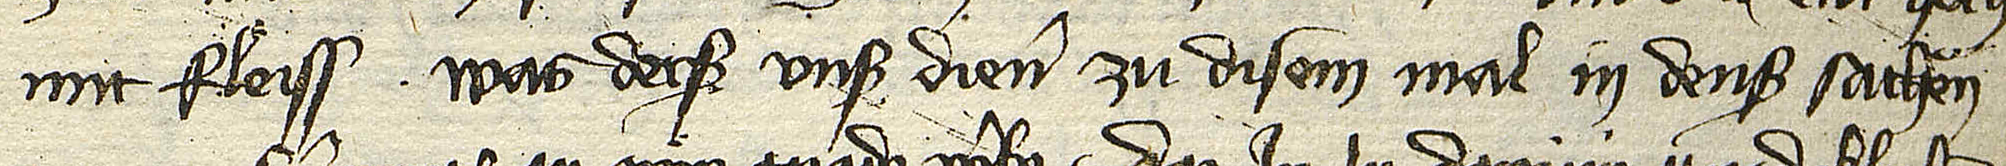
mit fleiſſ . was derſ* vnſ* dien* ʒu diſem mal in denſ* ſachen
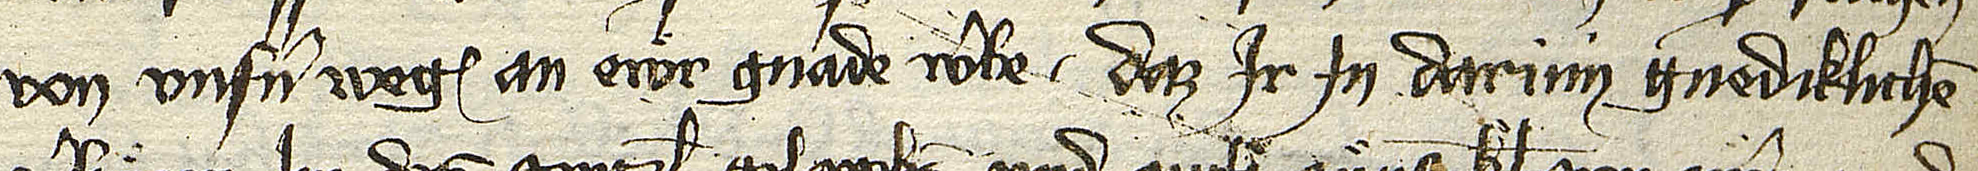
von vnſ*n weg* an ewr gnade w*be / daʒ Ir In darinn gnedikliche*
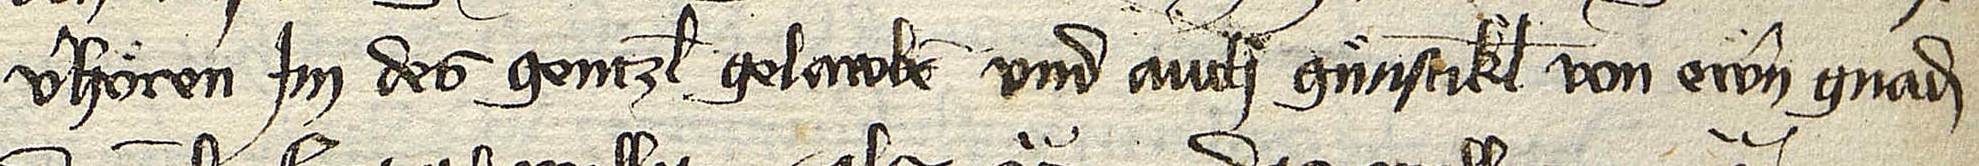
v*hören Im des gencʒl* gelawbe* vnd auch günſtikl* von ew*n gnad*
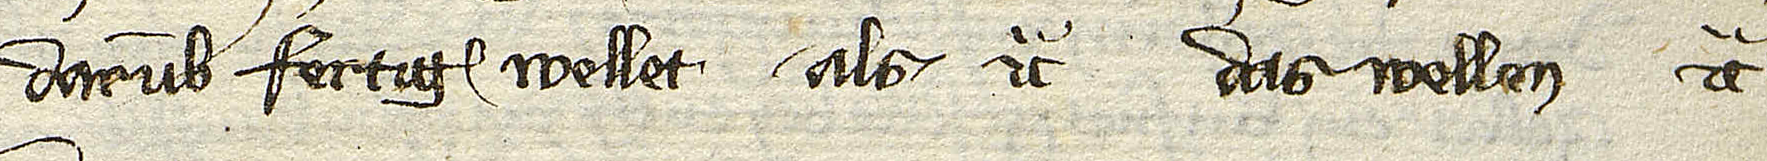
daru*b fertig* wellet / als ec* das wellen ec*
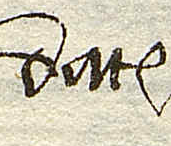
Dat*
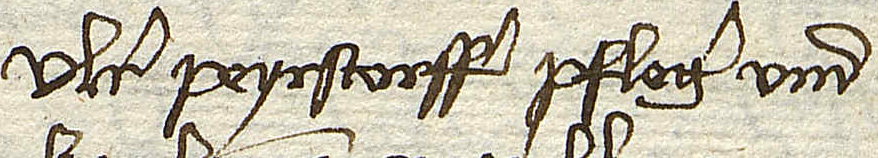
Vlr* peyrſtorff* pfleg* vnd
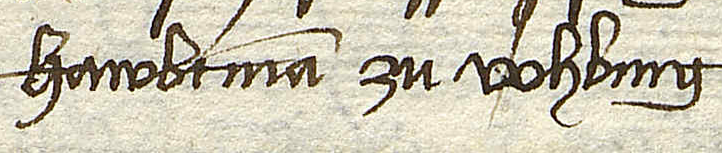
hawbtma* ʒu vohburg
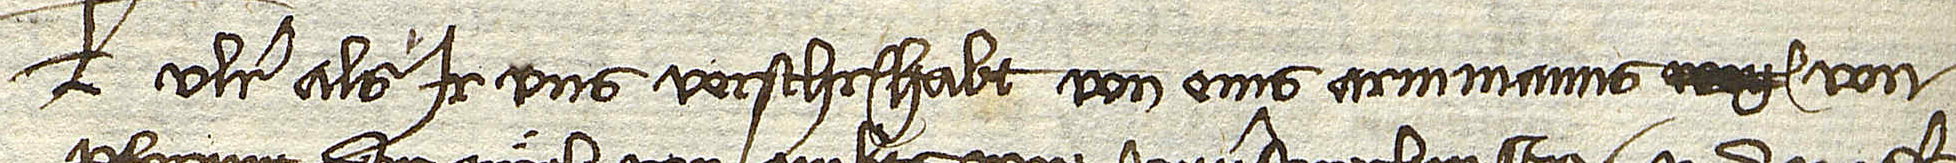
L* vlr* als Ir vns verſchr* habt von eins arm manns weg* von
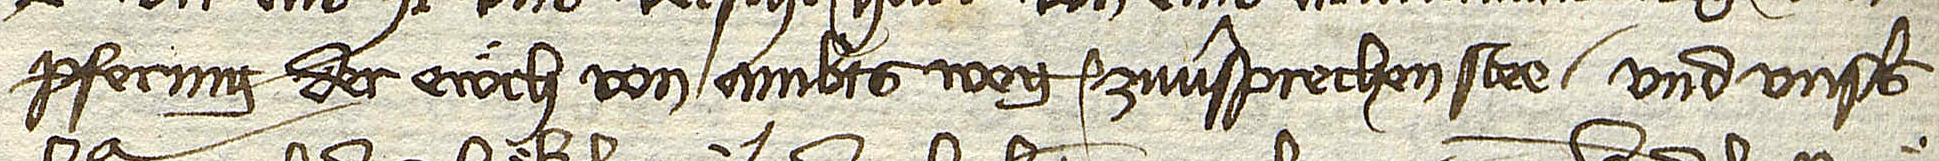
Pfering der ewch von ambts weg* ʒuu*ſprechen ſtee / vnd vnſ*s
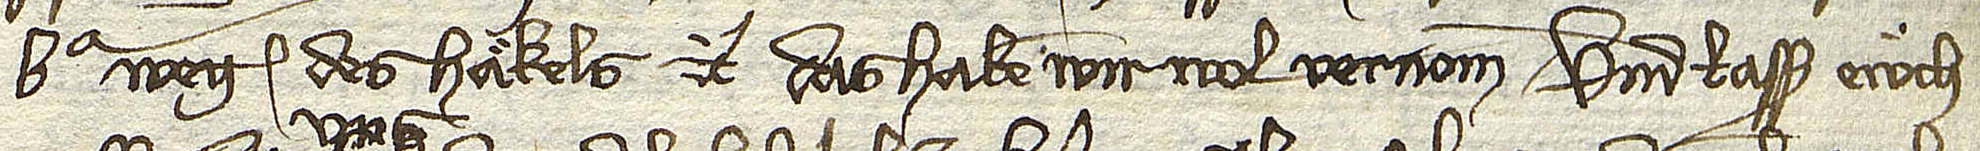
b* weg* des häkels ec* das habe* wir wol vernom* / Vnd laſſ* ewch
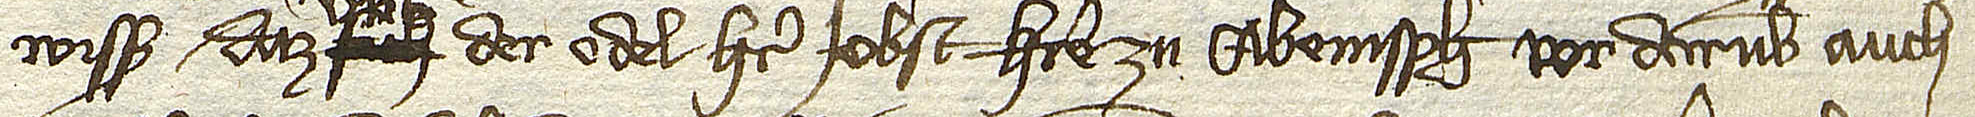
wiſſ* / daʒ ſich der edel h*r Iobſt H*re ʒu Abemſp*g vor daru*b auch
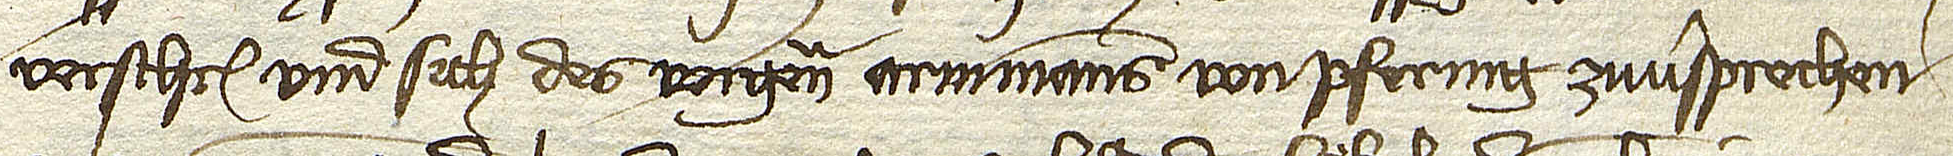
verſchr* vnd ſich des vorgen* armmans* von pfering ʒuu*ſprechen
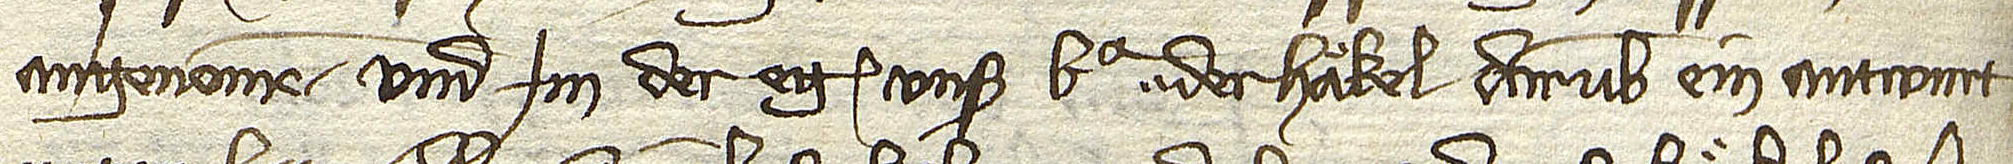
angenome* / vnd Im der eg* vnſ* b* ~ der häkel daru*b ein antwurt
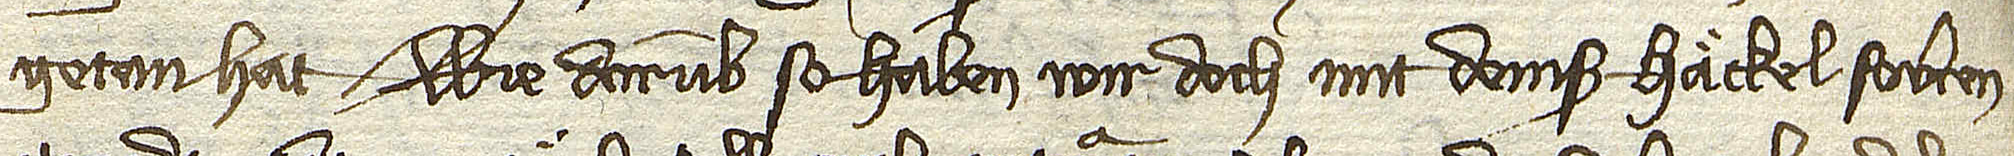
getan hat / Wie daru*b ſo haben wir doch mit demſ* häckel ſov*ren
